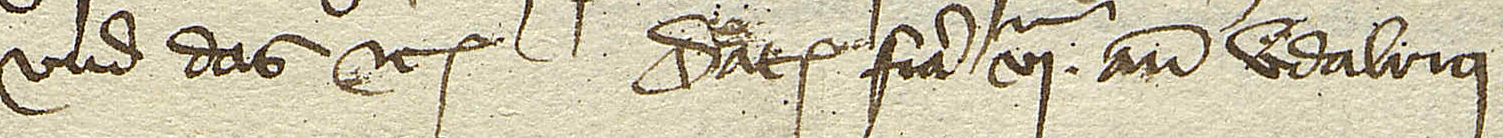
vnd das ec* Dat* fia* vi* . an* vdalrici
